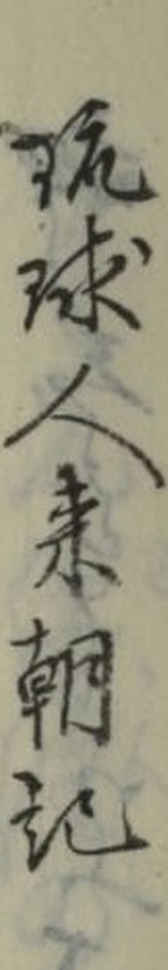琉球人来朝記
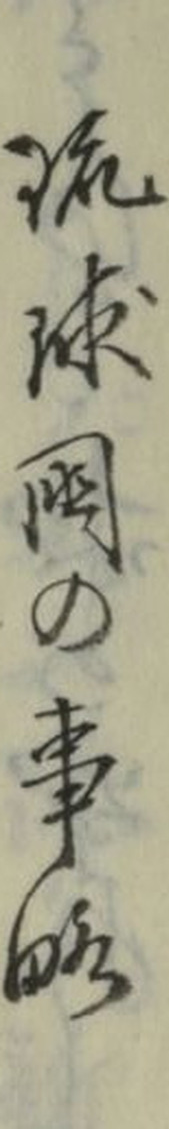琉球国の事略
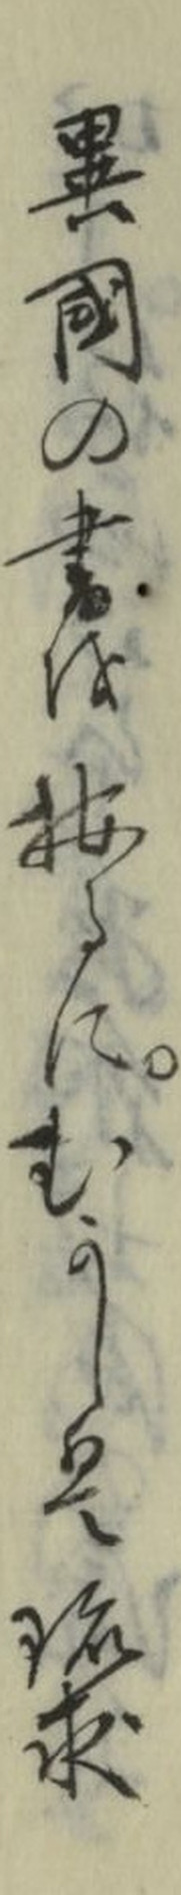異国の書を按るに。むかし是琉求
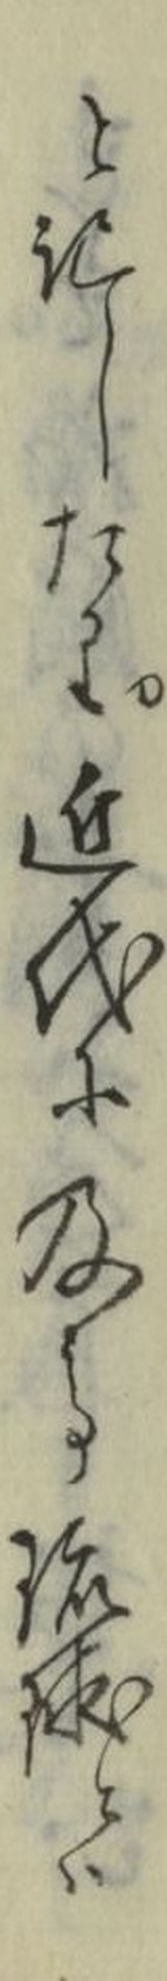と記したり。近代に及て琉球とは
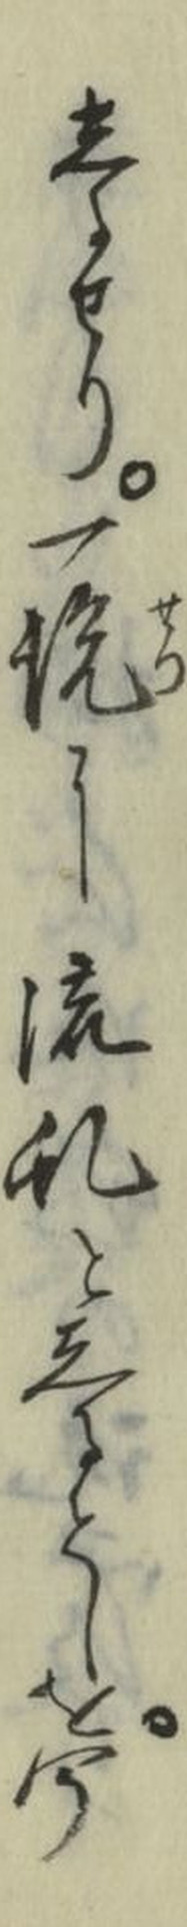しるせり。一説に流虬としるせしを。写
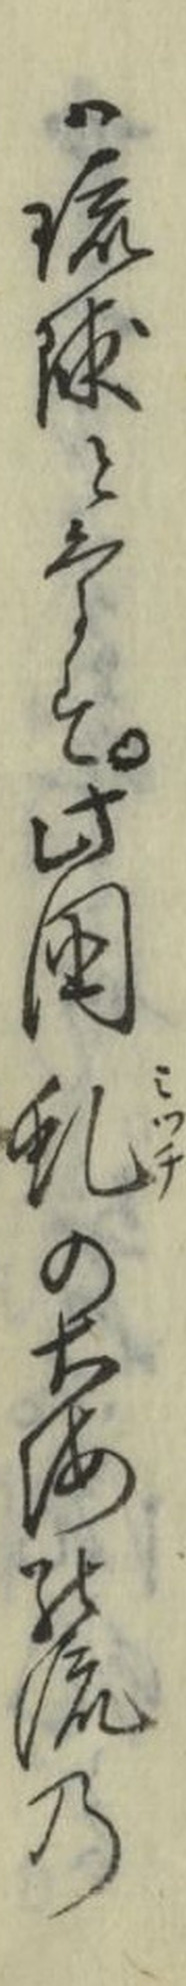は琉球としるす。此国虬の大海の流の

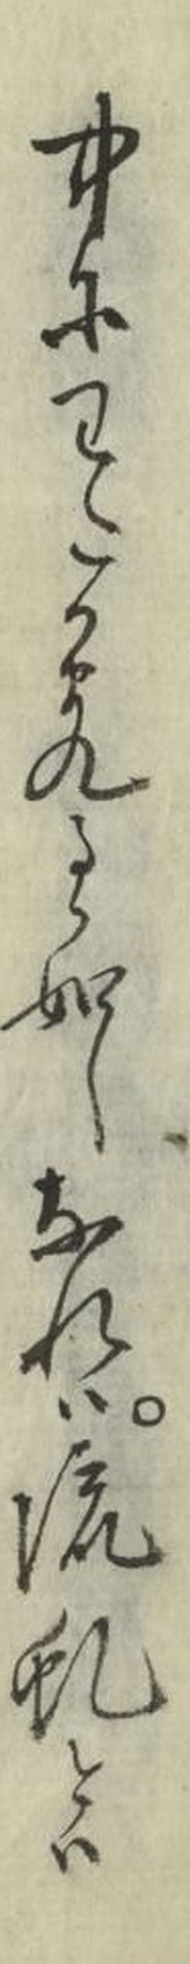中にわたかまれるゝ如くなれは。流虬とは
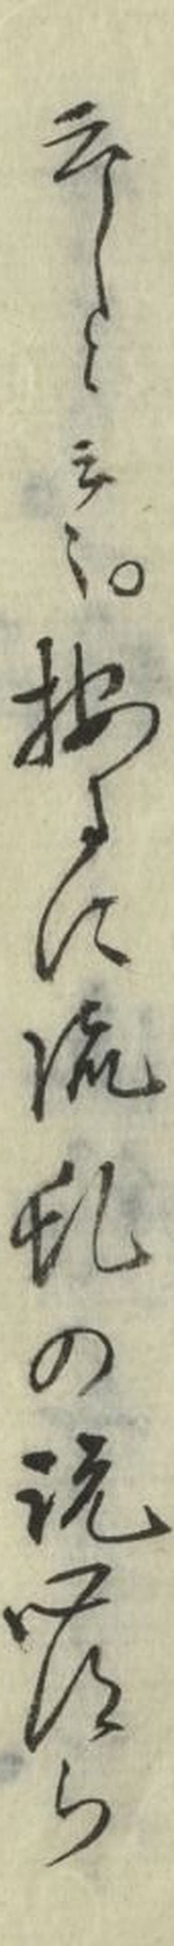云しと云々。按るに流虬の説心得ら
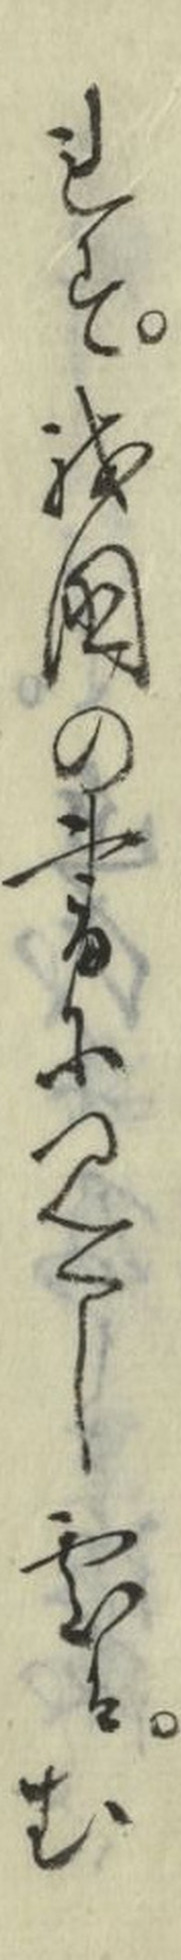れす。我国の書に見へし処は。む
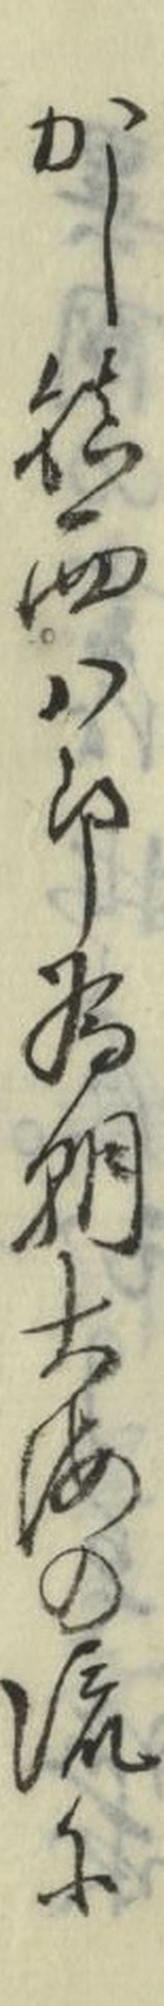かし鎮西八郎為朝大海の流に
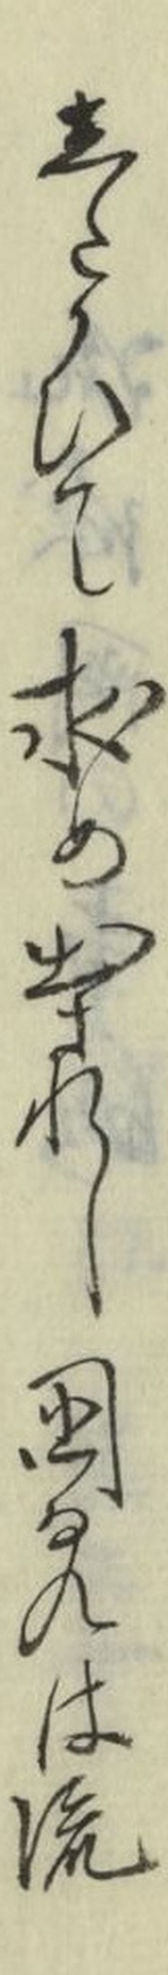したかひて求め出されし国なれは流
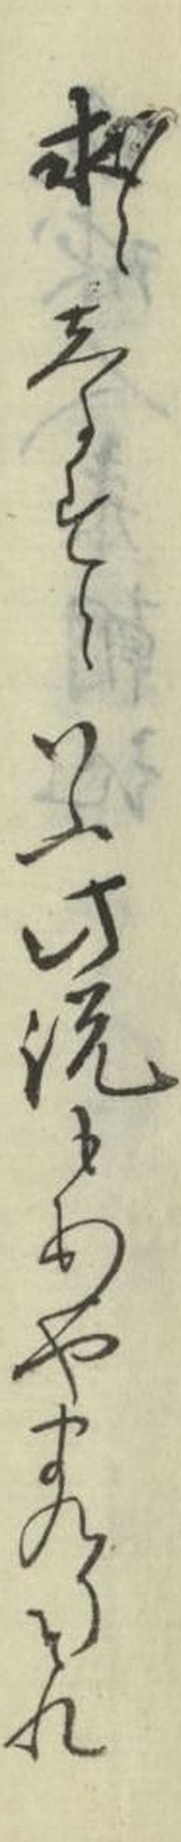求としるすといふ此説もあやまれりそれ
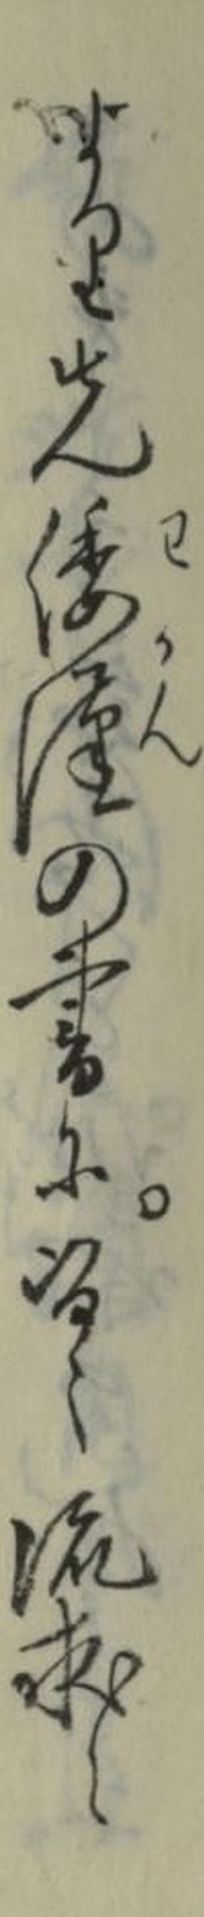より先倭漢の書に。有之流求と
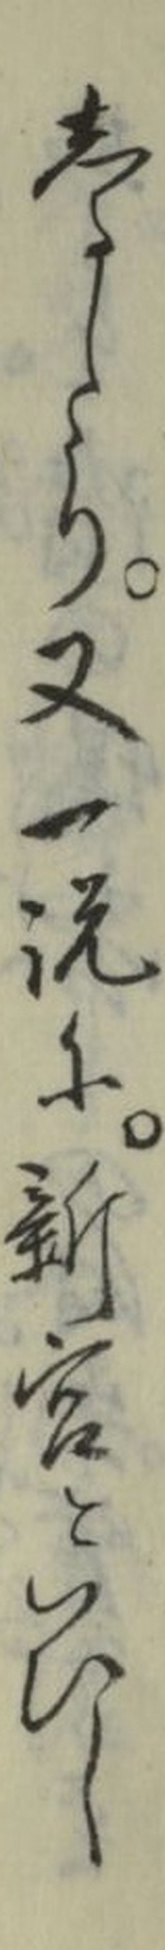しるしたり。又一説に。新宮といひし
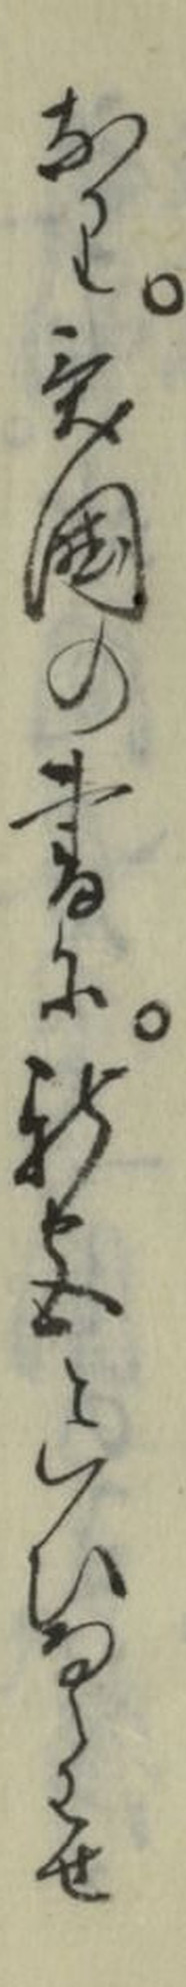なり。異国の書に。新宮といひならわせ
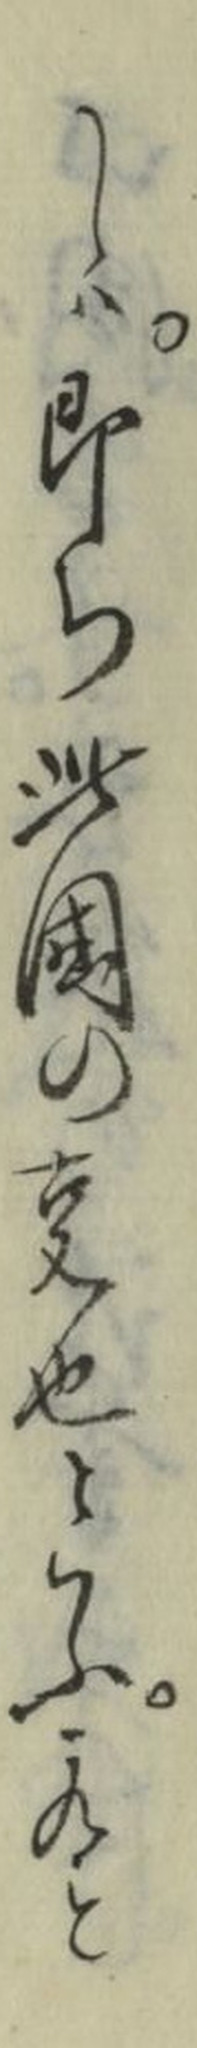しは。即ち此国の事也といふ。これも
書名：琉球人来朝記 一之二
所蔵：University of the Ryukyus Library
